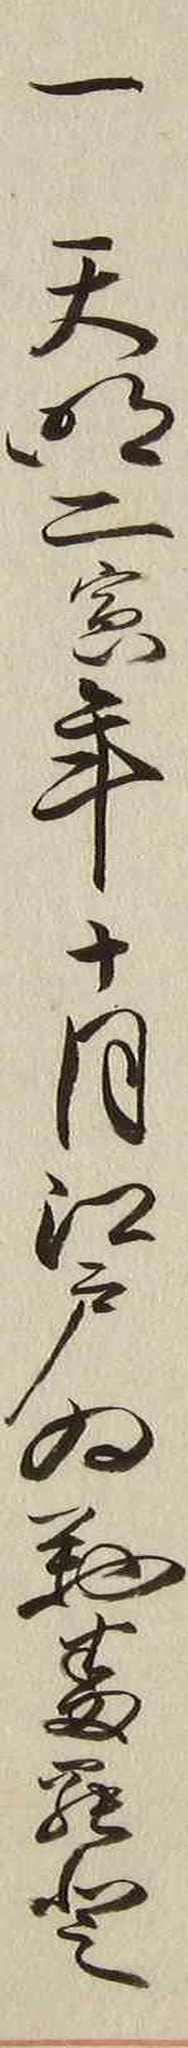一天明二寅年十月江戸為勤番罷登
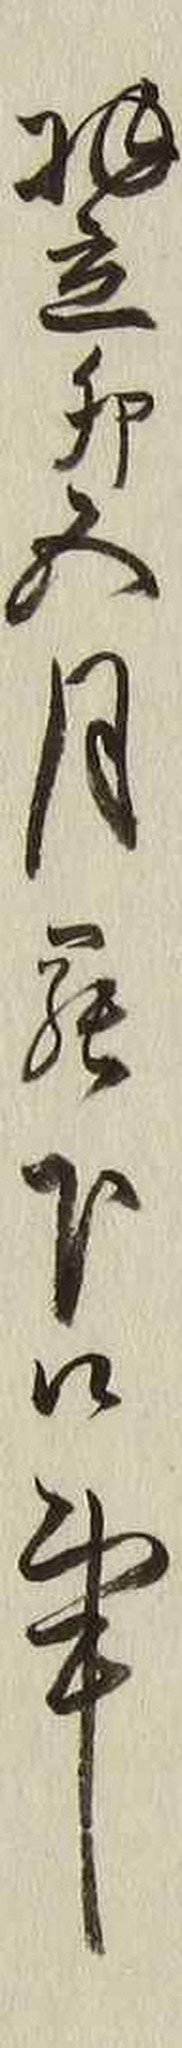翌卯五月罷下候事
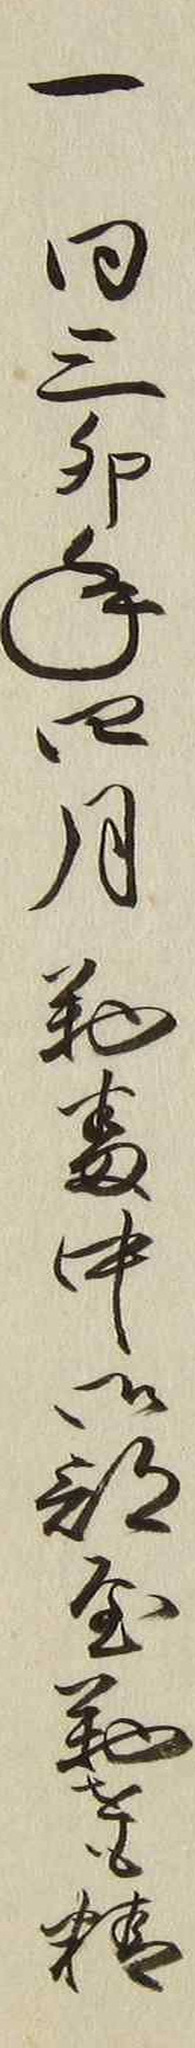一同三卯年四月勤番中御部屋勤をも精
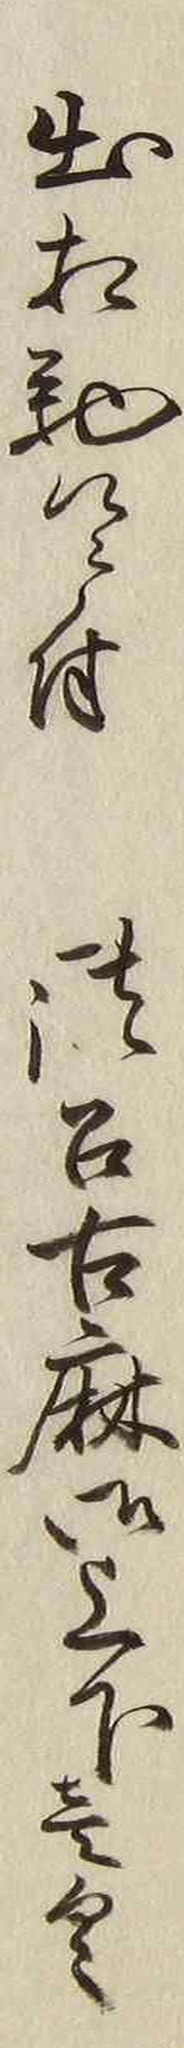出相勤候ニ付御召古麻御上下壱具
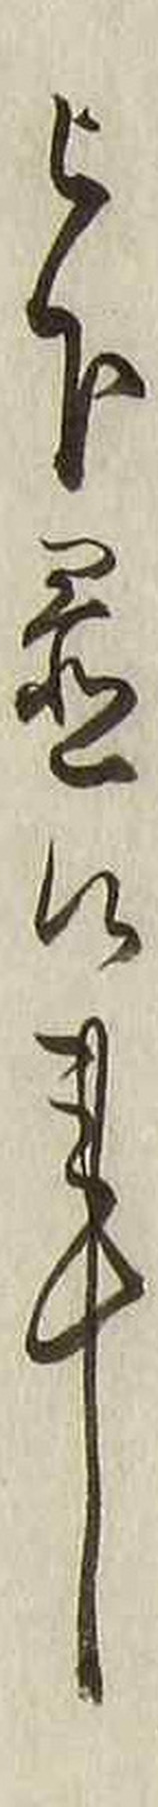被下置候事
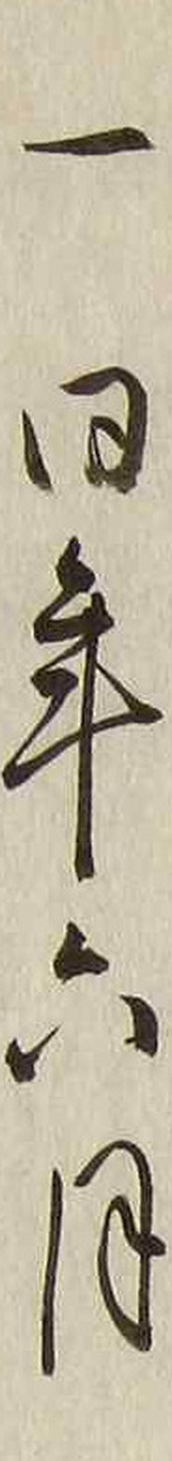一同年六月
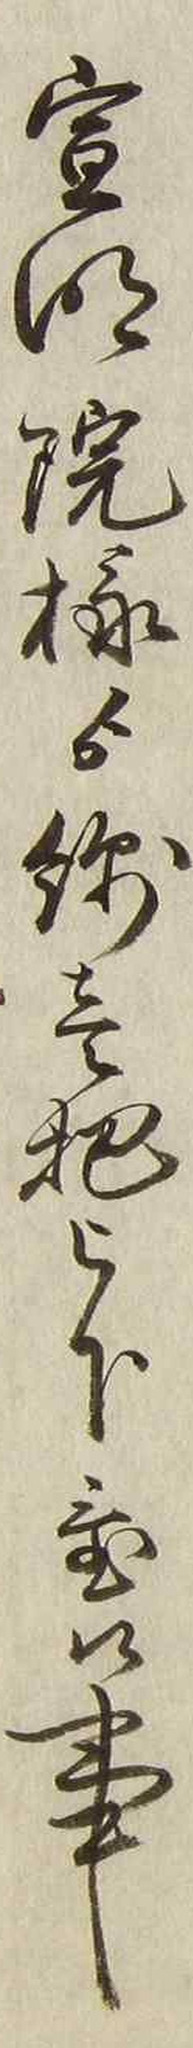宣明院様ゟ綿壱把被下置候事

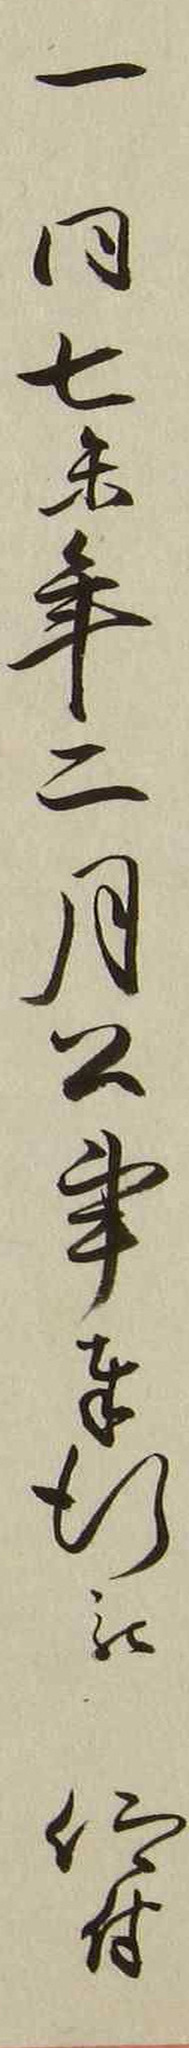一同七未年二月公事奉行被仰付
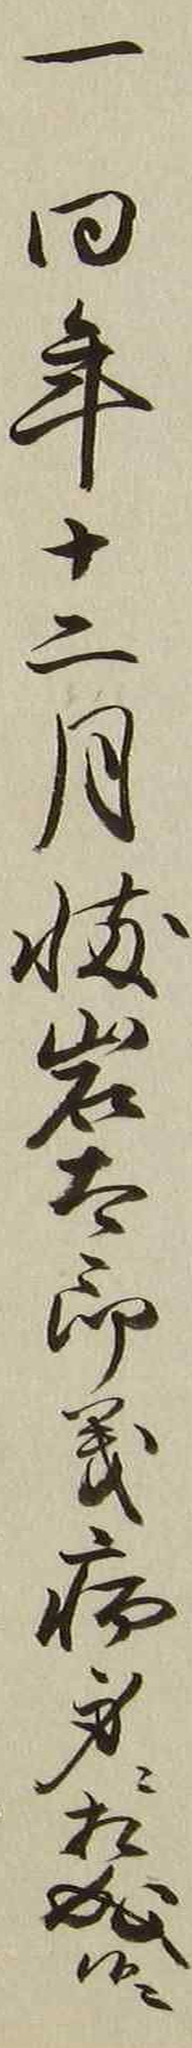一同年十二月悴岩太郎義病身ニ相成候ニ
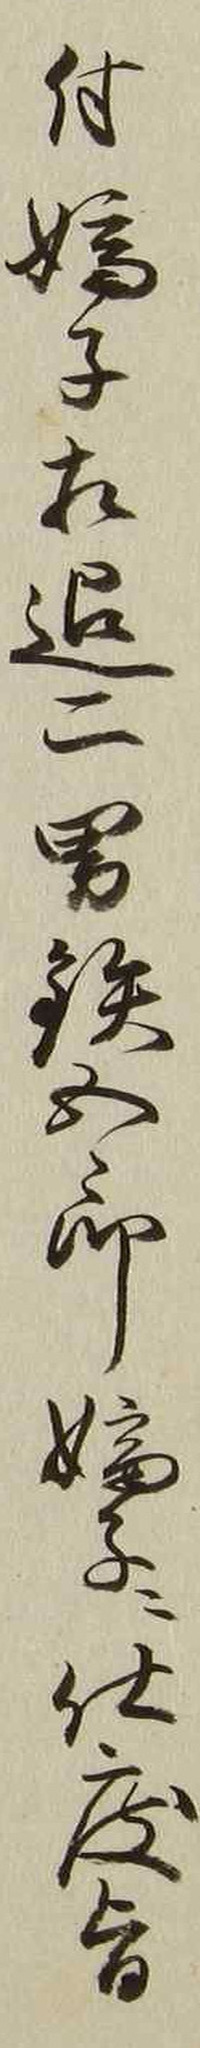付嫡子相退二男鉄五郎嫡子ニ仕度旨
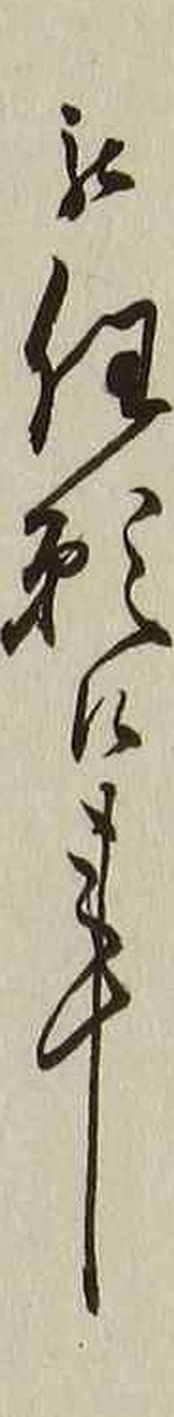被任願候事
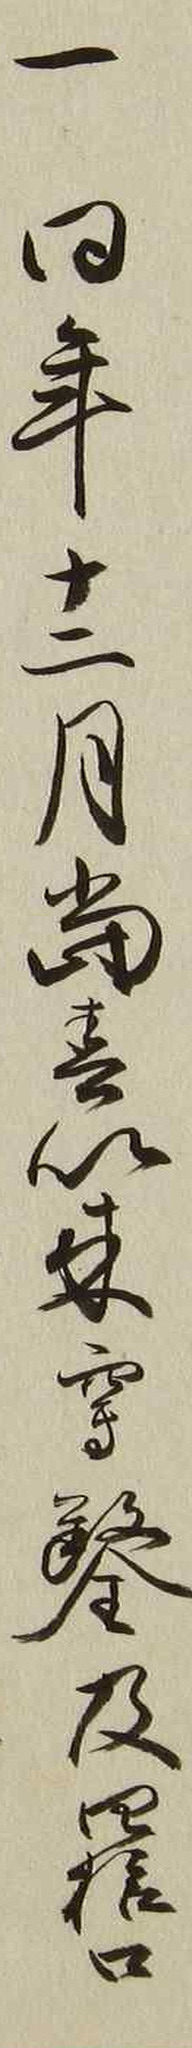一同年十二月当春以来穿鑿及四口
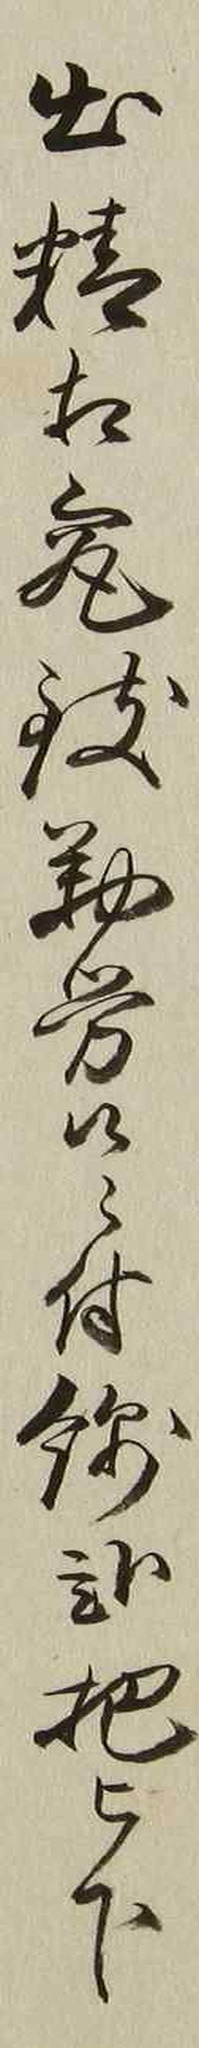出精相究致勤労候ニ付綿弐把被下
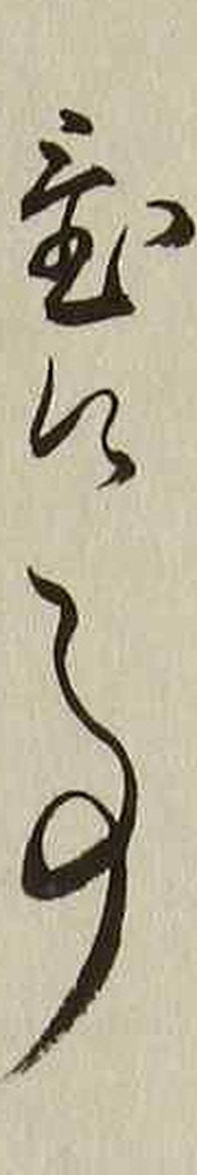置候事
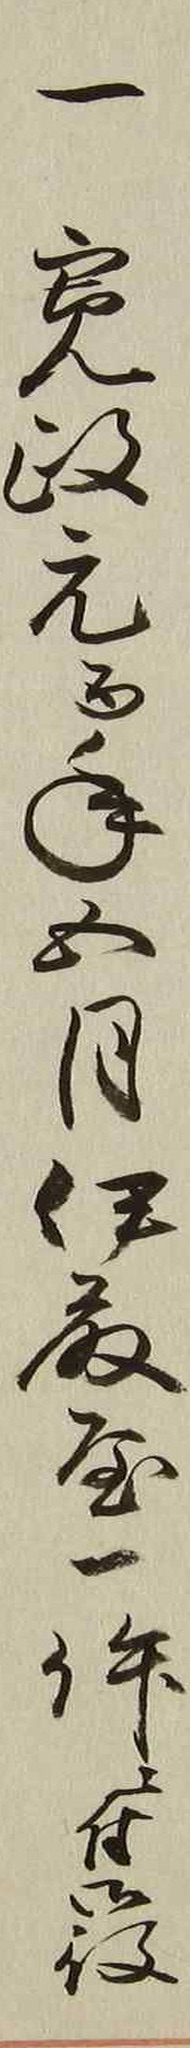一寛政元酉年五月伊藤屋一件ニ付御役
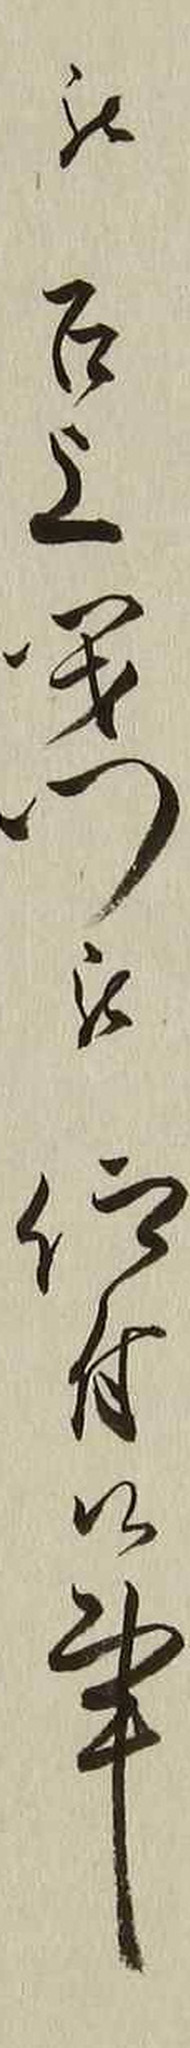被召上閉門被仰付候事
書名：諸士系譜　巻之21　い之部21
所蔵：会津若松市立会津図書館
